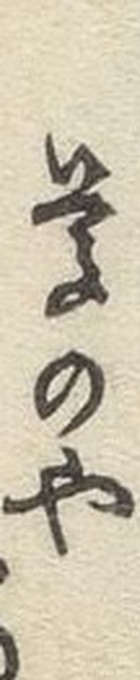学のや
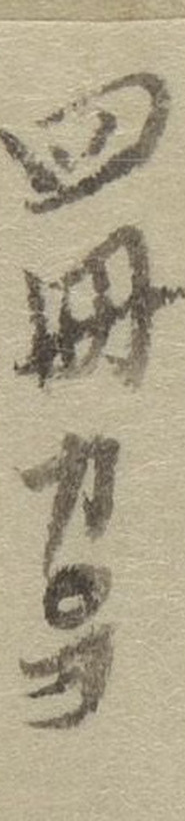四冊カロヨ
